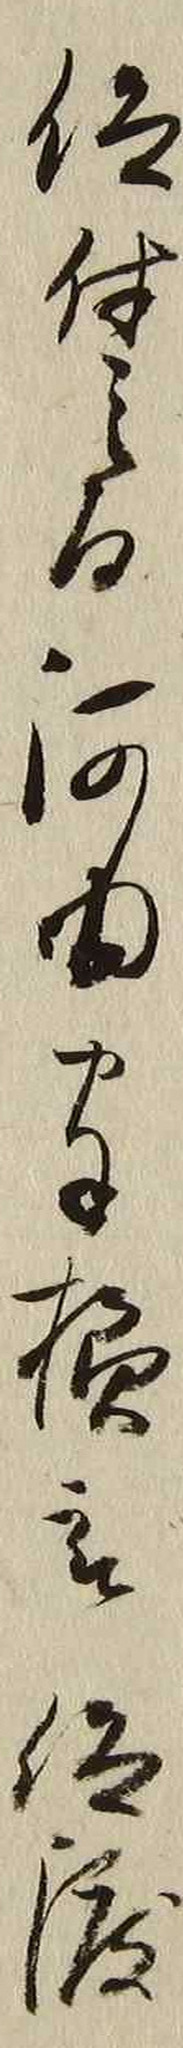仰付之旨河内守様被仰渡
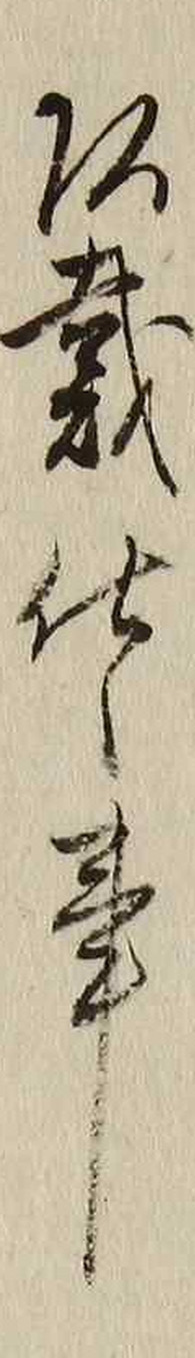頂戴仕候事
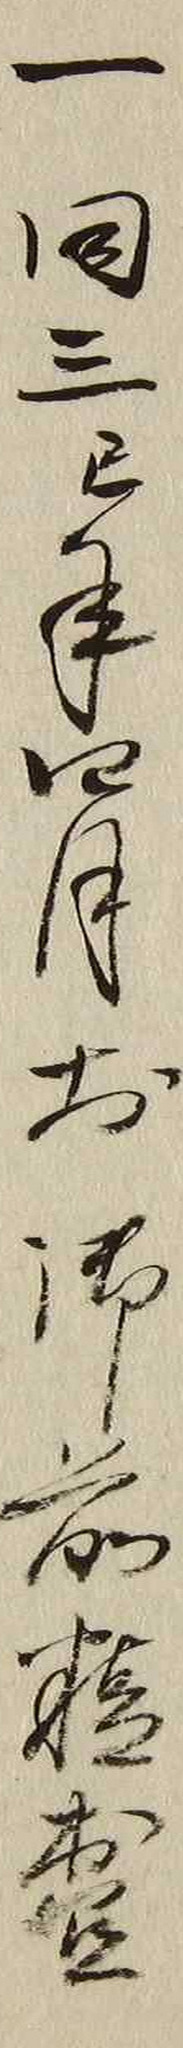一同三巳年四月於御前精出宜
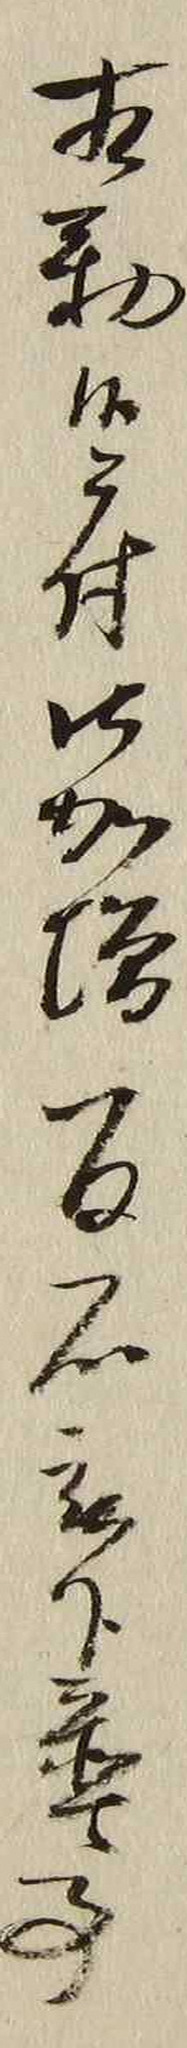相勤候ニ付御加増百石被下置候事
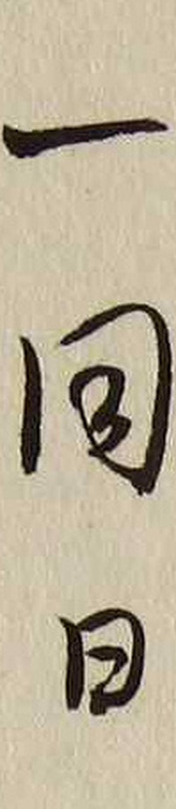一同日
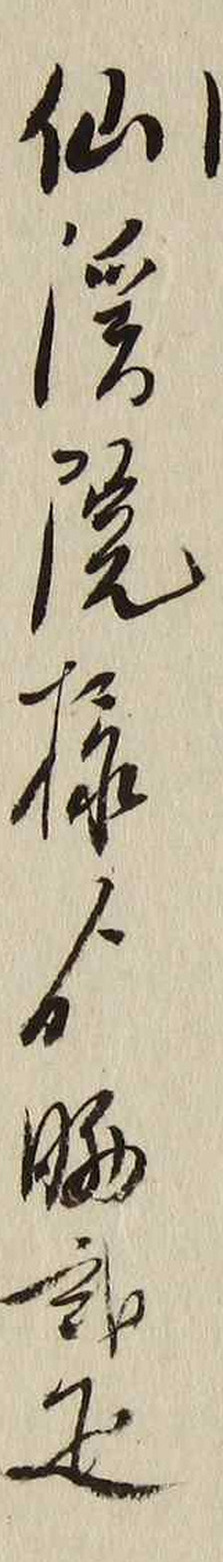仙渓院様ゟ晒弐疋
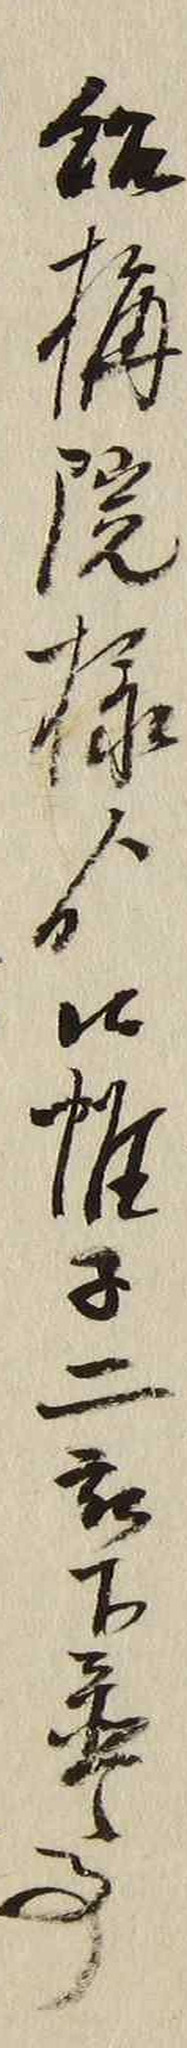紹栴院様ゟ御帷子二被下置候事
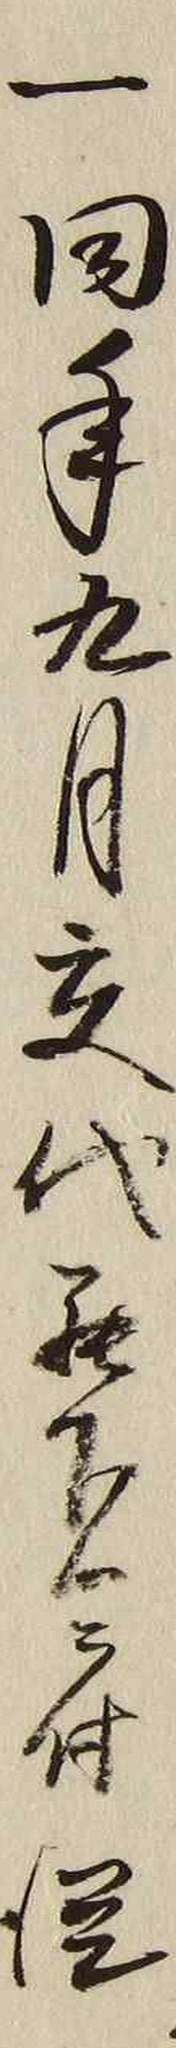一同年九月交代罷下候ニ付従
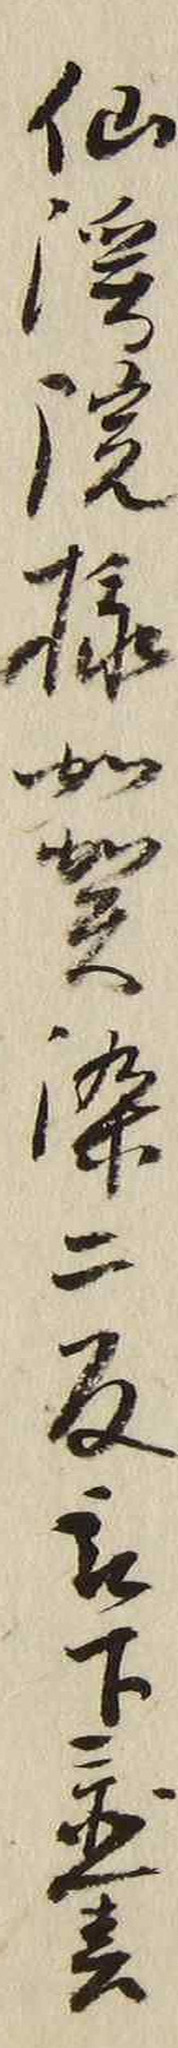仙渓院様加賀染二反被下置春

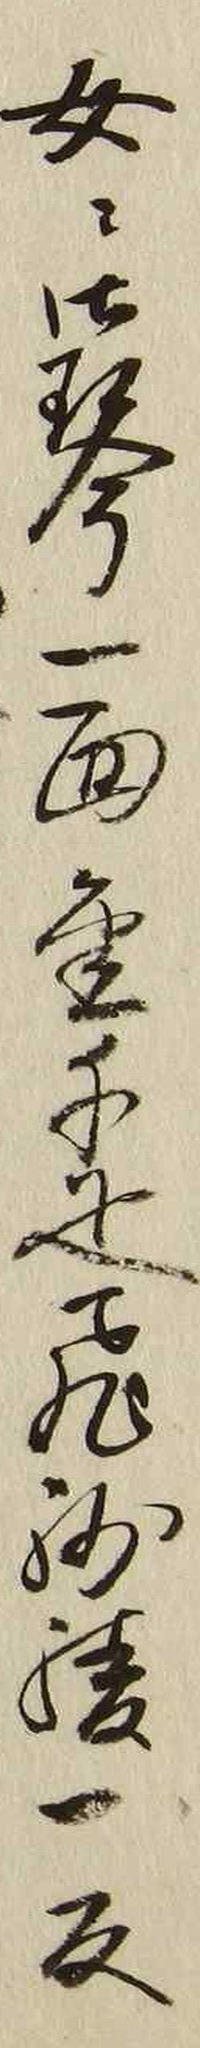女ニ御琴一面金千疋飛紗綾一反
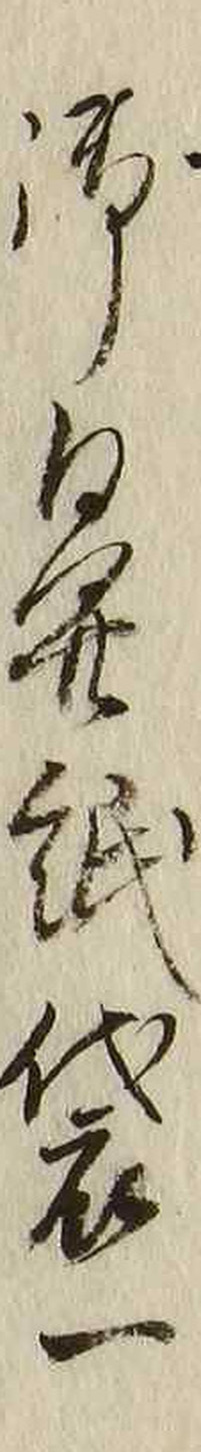御鼻紙袋一
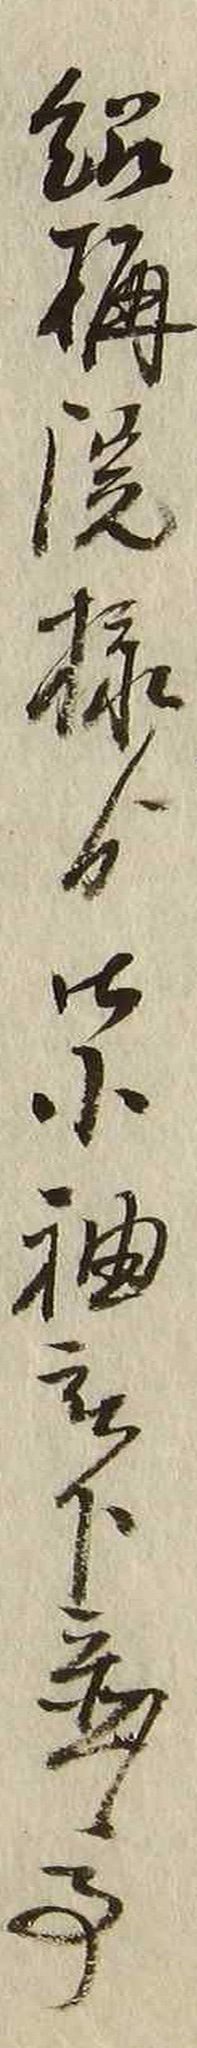紹栴院様ゟ御小袖被下置候事
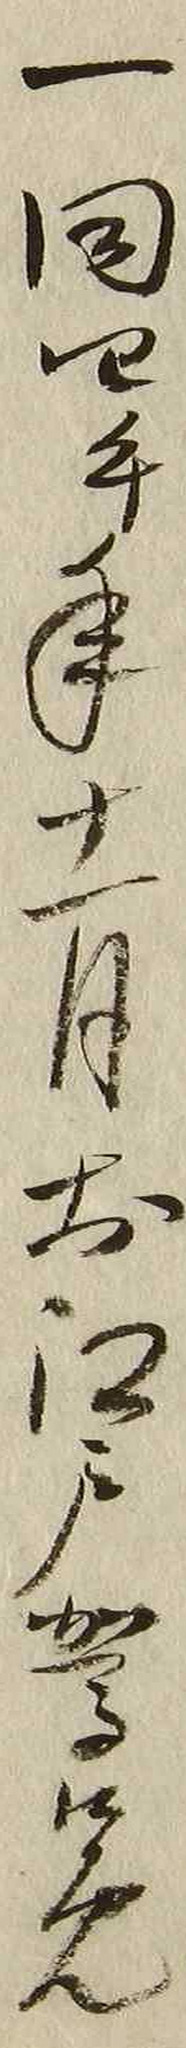一同四午年十一月於江戸駕御免
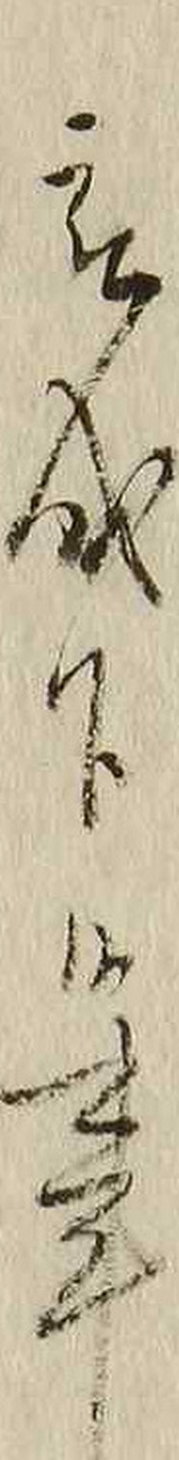被成下候事
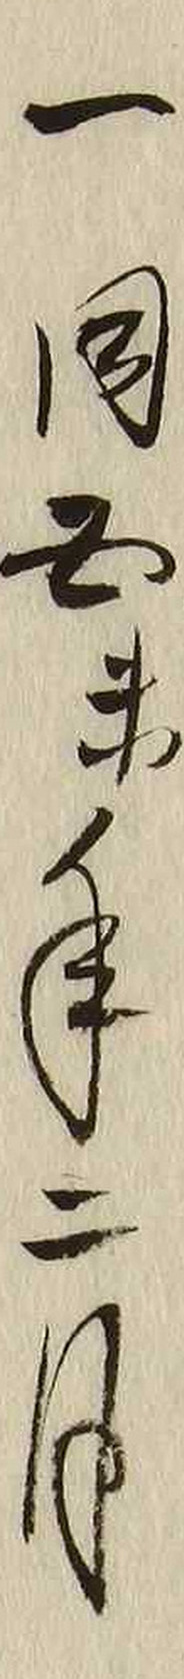一同五未年二月
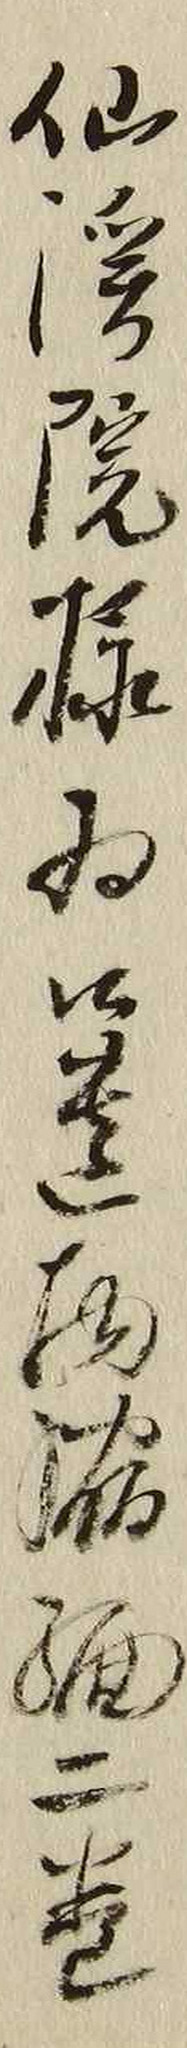仙渓院様為御遺物縮緬二巻
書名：諸士系譜　巻之351　す之部1
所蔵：会津若松市立会津図書館
